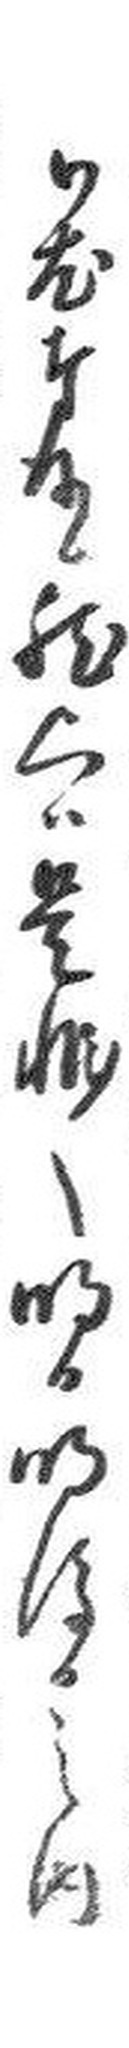御尤奉存候然上ㇵ是非〳〵明日明後日之内
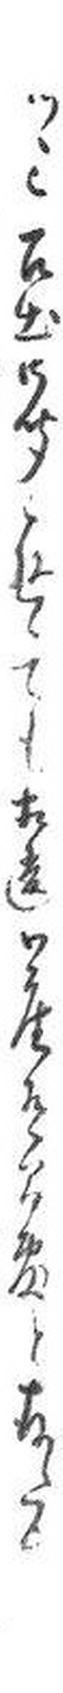ツゝ被召出御聞被遊候ても相違御座有間敷と存候以上
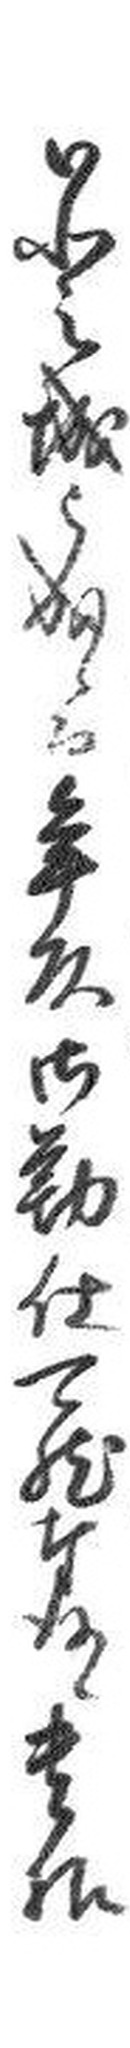御登城被成候而年頭御勤仕可然奉存候貴様
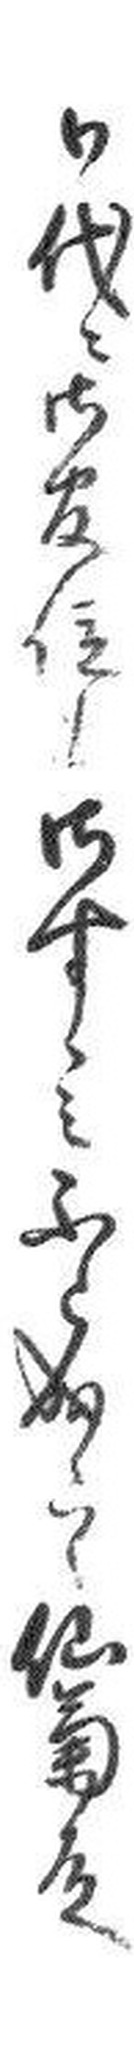御代ニ御官位も御すゝミ不被成候ㇵゝ仙菊殿
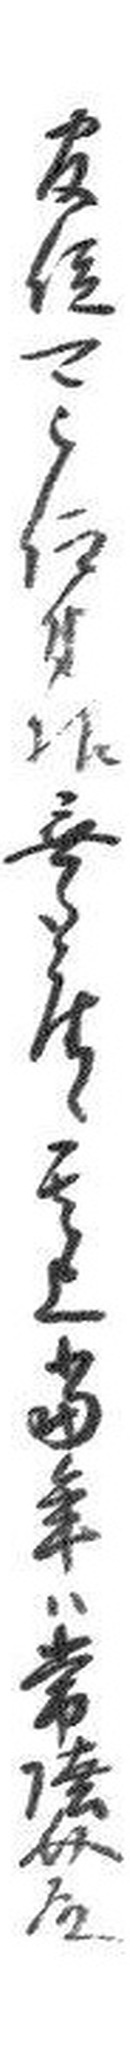官位可被仰付様無御座候其上当年ㇵ常陸介殿
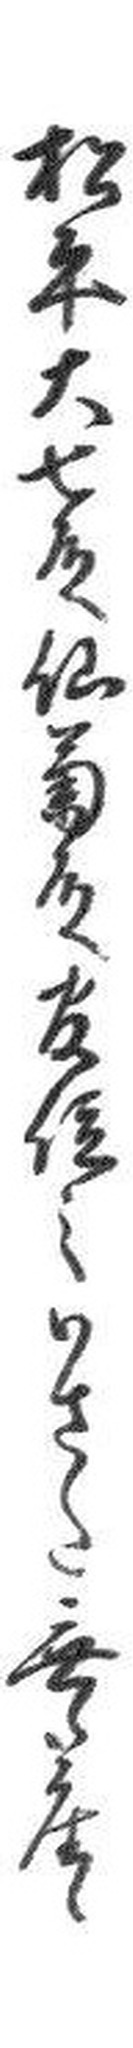松平大七殿仙菊殿官位之御さた無御座候
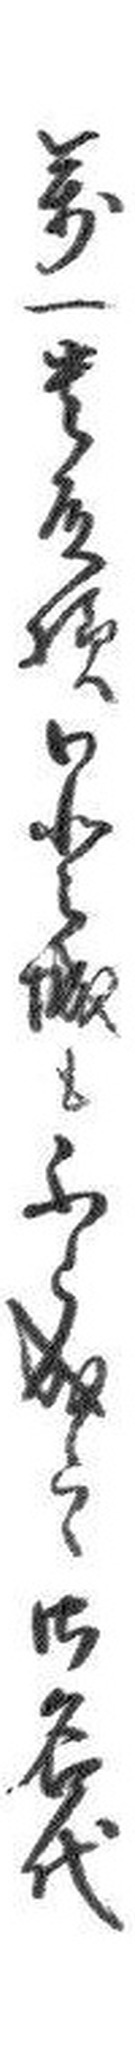万一貴殿様御登城も不被成候ㇵゝ御名代
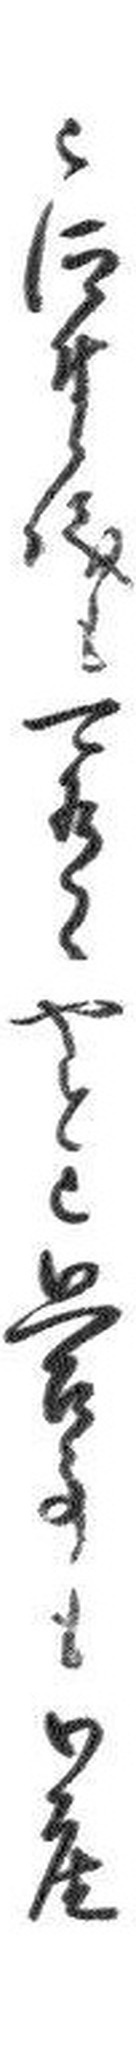被仰付候儀も可有之やと被思召事も御座
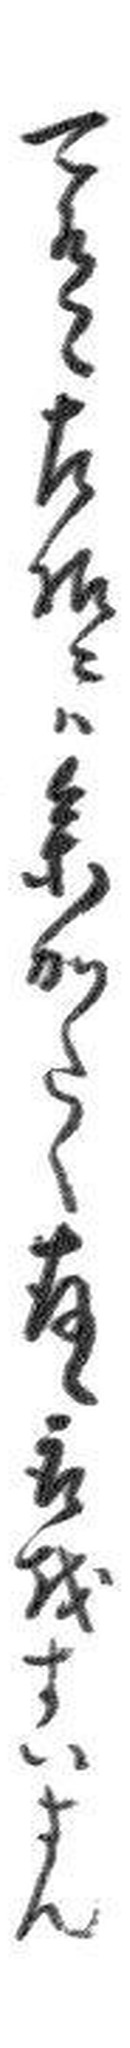可有候左様ニㇵ参かたく存候取越すいさん
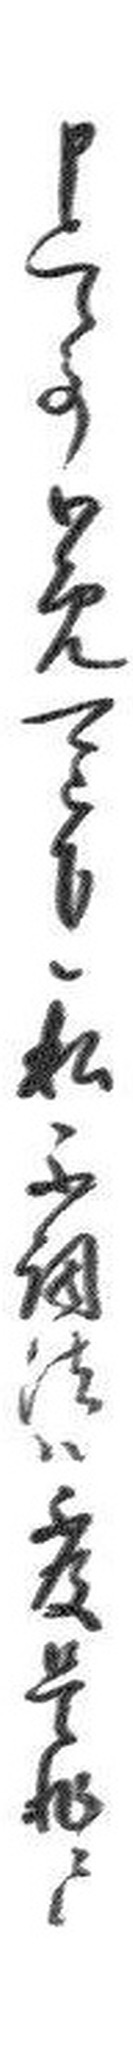申上候事御免可被下候私不調法ㇵ不及是非ニ候
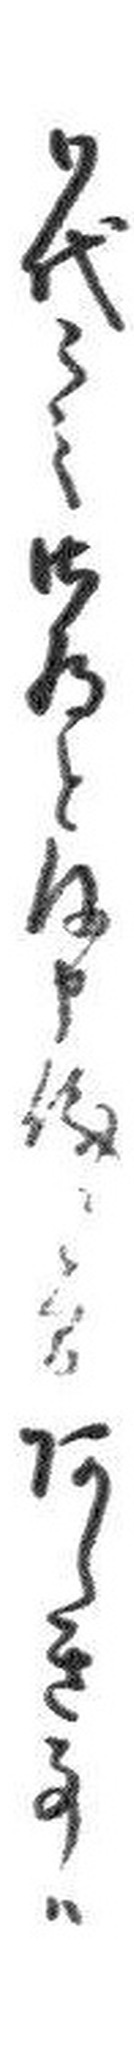御代々之御為と存申儀ニ候間あしき事ㇵ
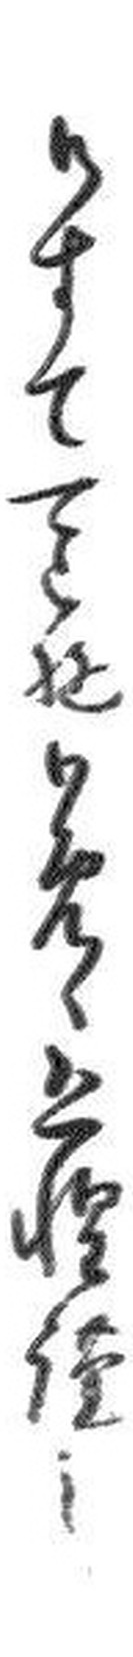御すて可被遊御免候恐惶謹言
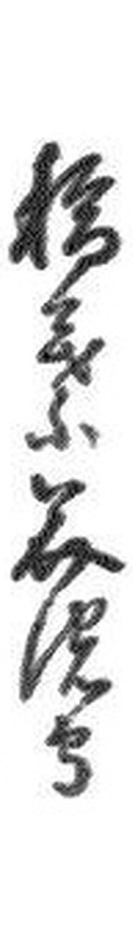稲葉美濃守
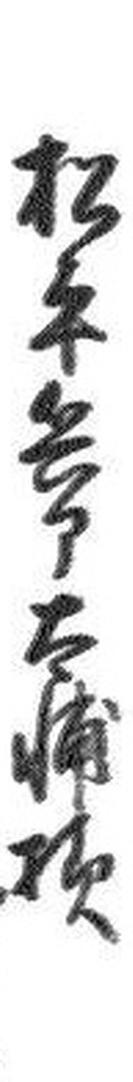松平兵部大輔様
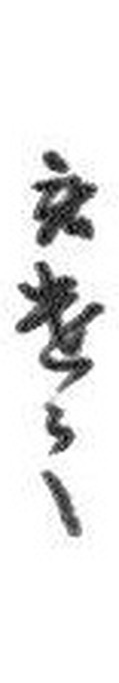被遣之

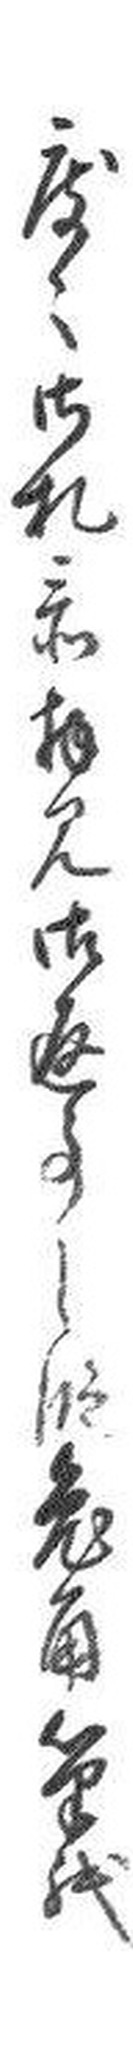度々御札忝拝見御返事之段兎角筆紙
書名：家譜 十一 昌親公 従延宝二年到延宝四年八月
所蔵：福井県文書館 Fukui Prefectural Archives
